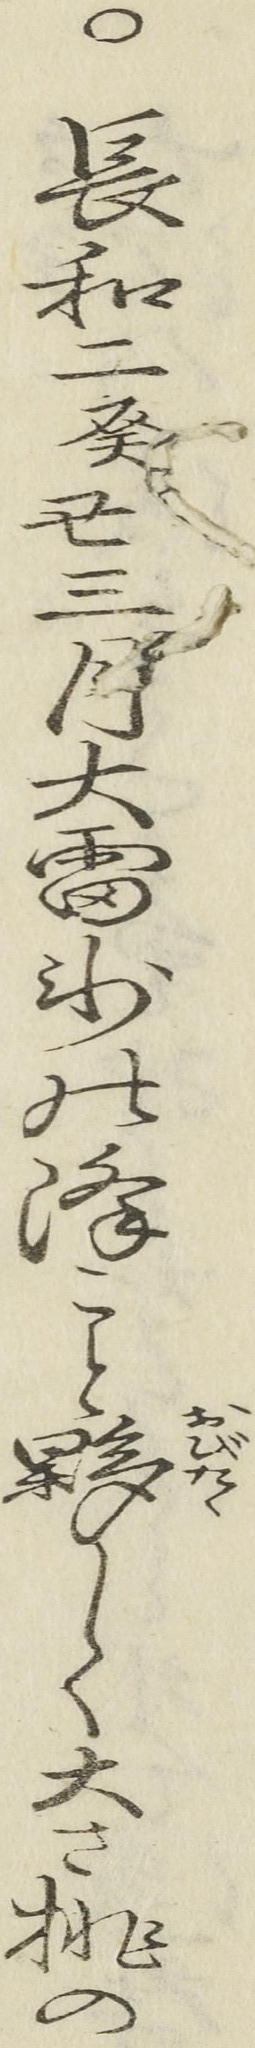〇長和二癸丑三月大雷氷の降こと夥しく大さ桃の
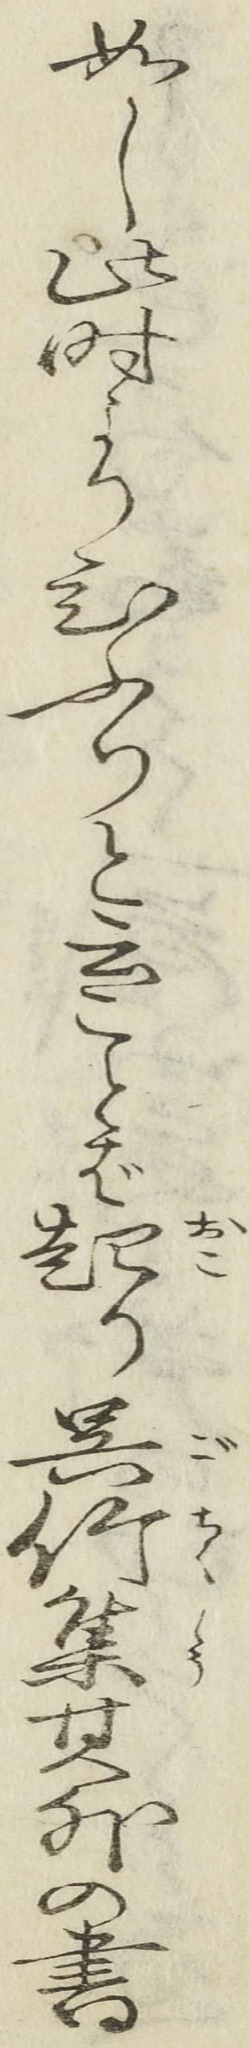如し此時よりひふりと云ことば起り呉竹集其外の書
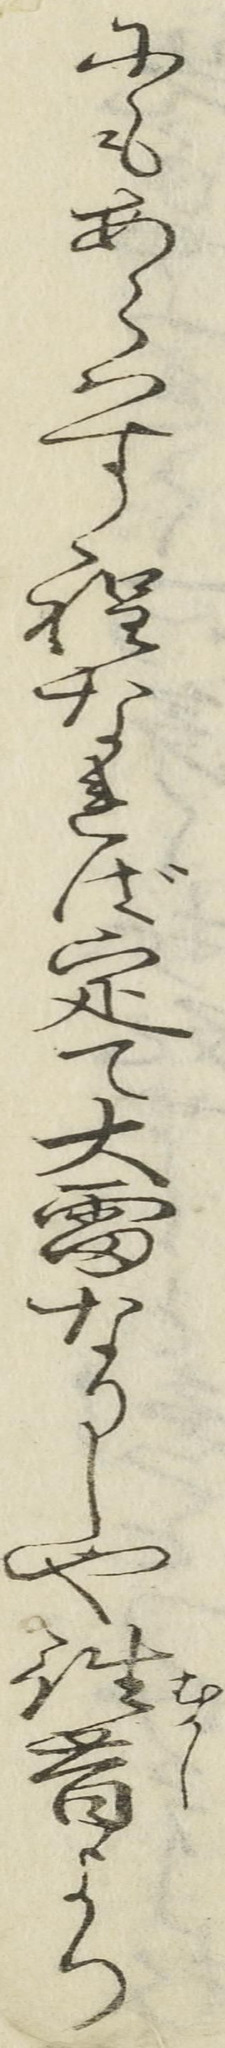にもあらはす程なれば定て大雷なりしや往昔より
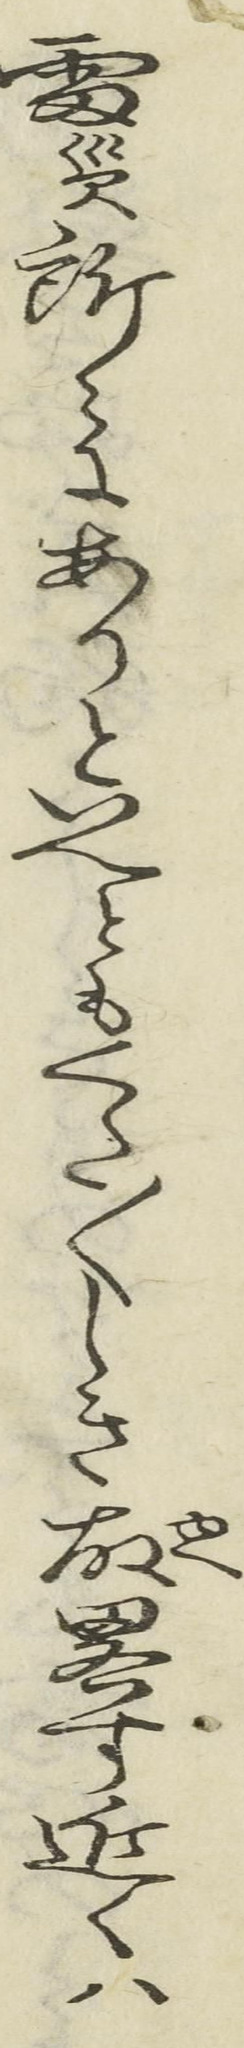雷災所々にありといへどもくた〳〵しき故略す近くは
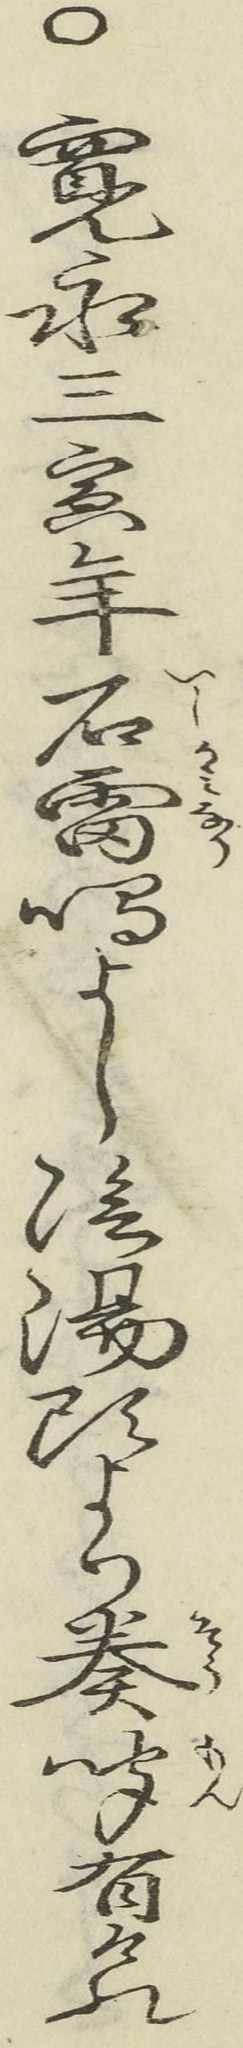〇寛永三寅年石雷鳴よし陰陽頭より奏聞有けれ
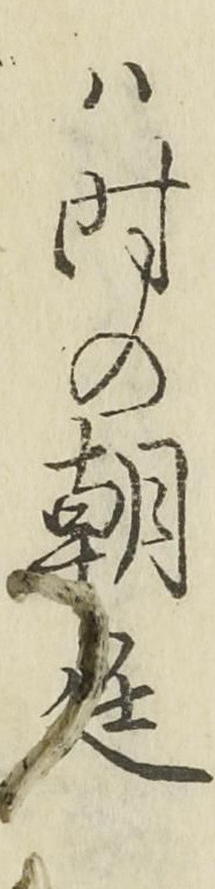は時の朝廷
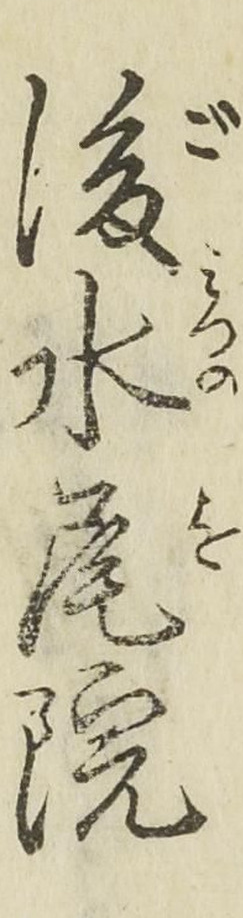後水尾院
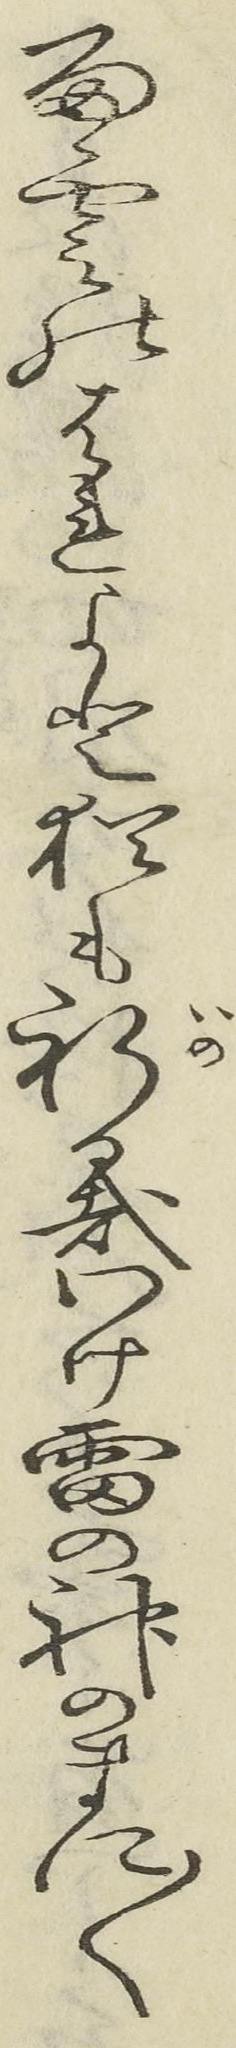雨雲のはれよと猶も祈る哉わけ雷の神のまに〳〵
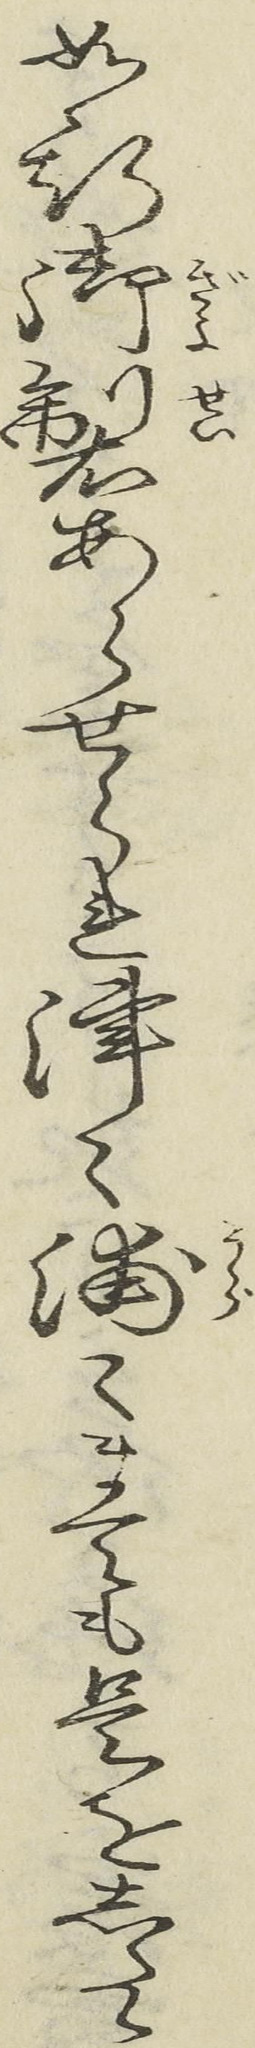如斯御製あらせられ津々浦々まても是をしたた
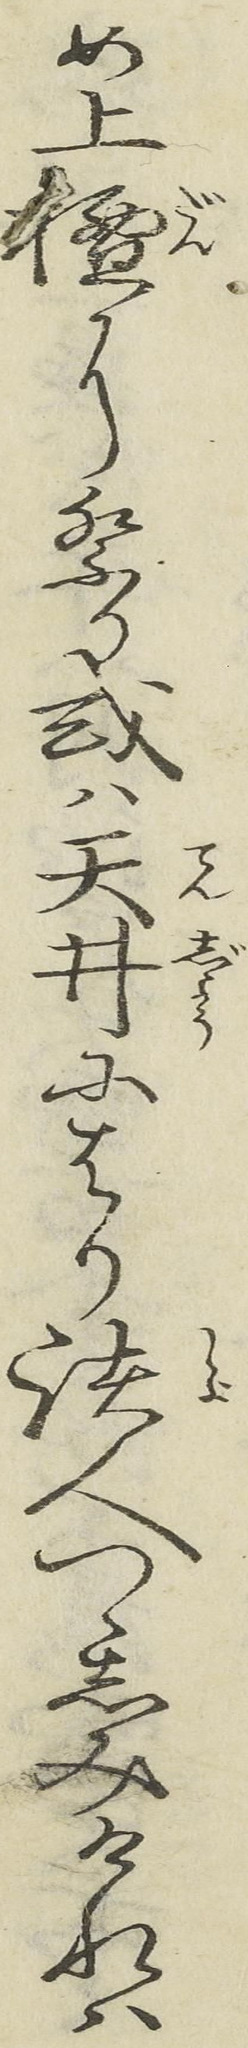め上壇に祭り或は天井にはり諸人つつしみけれは
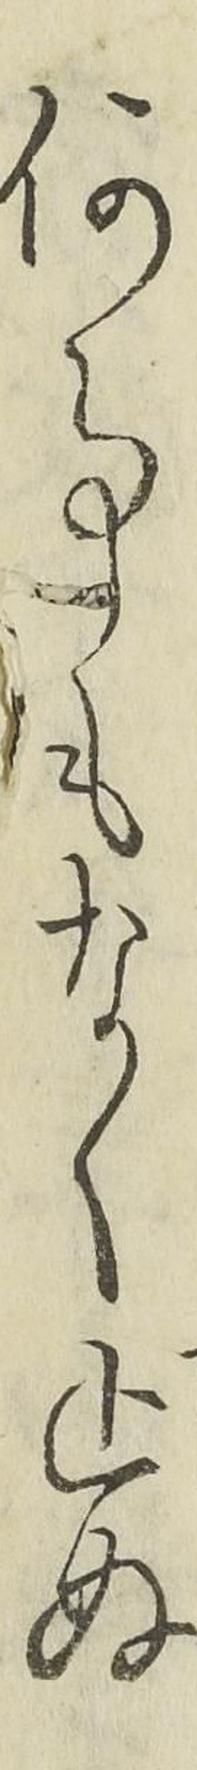何事もなく止ぬ
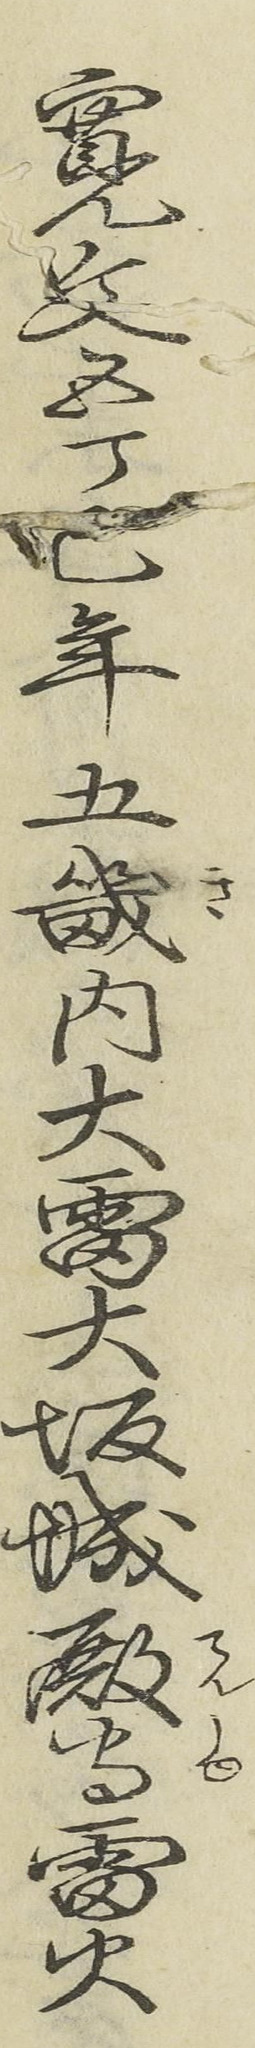〇寛文五丁巳年五畿内大雷大坂城殿守雷火

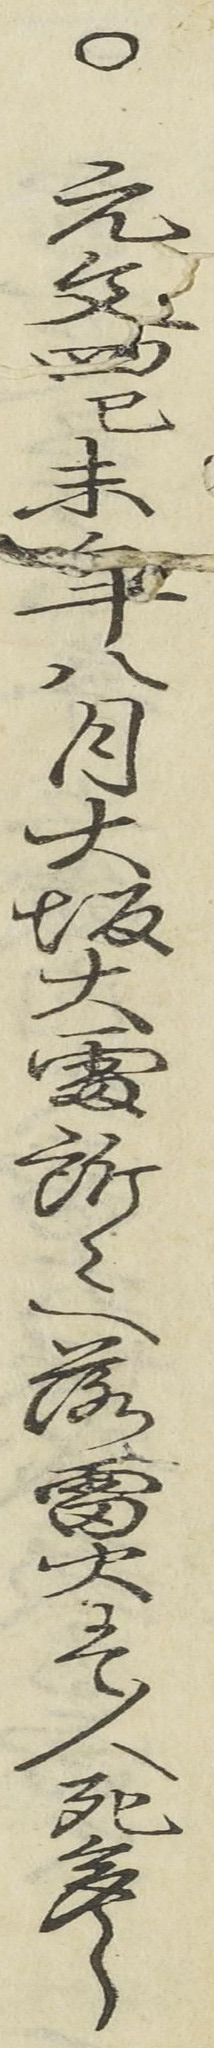〇元文四己未年八月大大雷所々へ落雷火にて人死多し
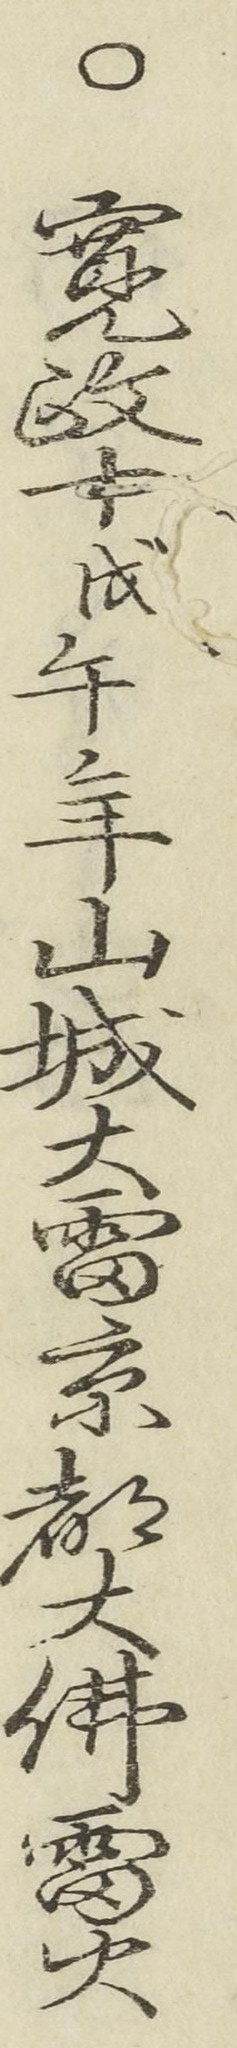〇寛政十戊午年山城大雷京都大仏雷火
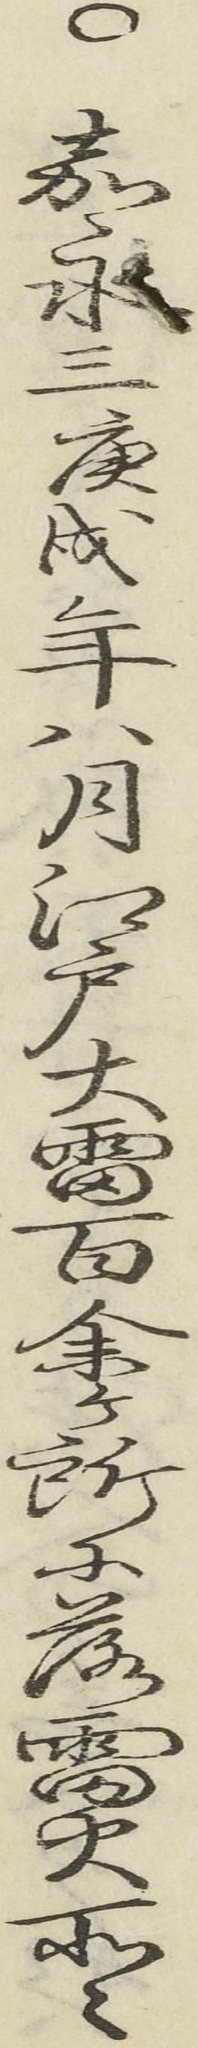〇嘉永三庚戌年八月江戸大雷百余ヶ所に落雷火所々
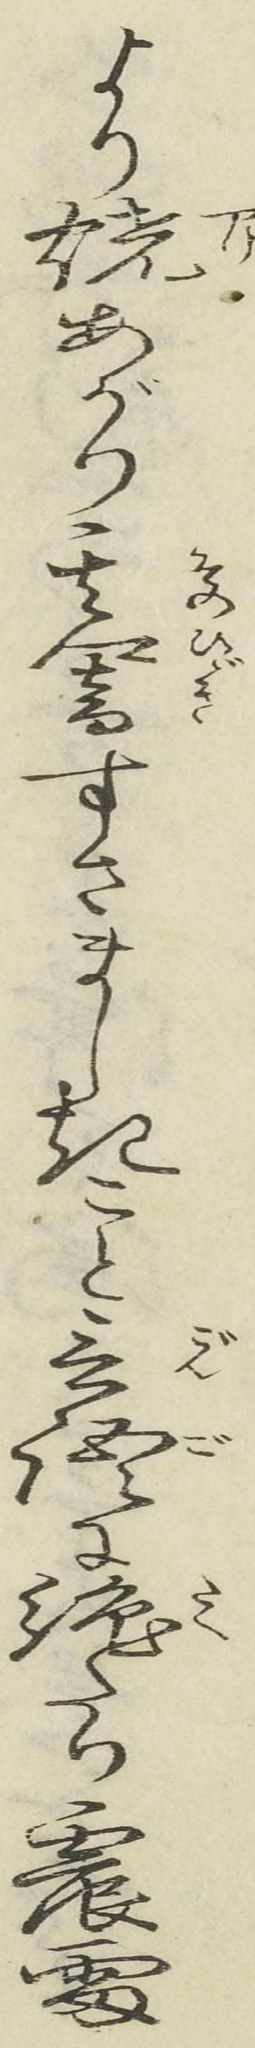より焼あがり其響すさましきこと言語に絶たり震雷
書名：震雷考説　全
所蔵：東京大学地震研究所図書室 Earthquake Research Institute Library, The University of Tokyo, JAPAN
